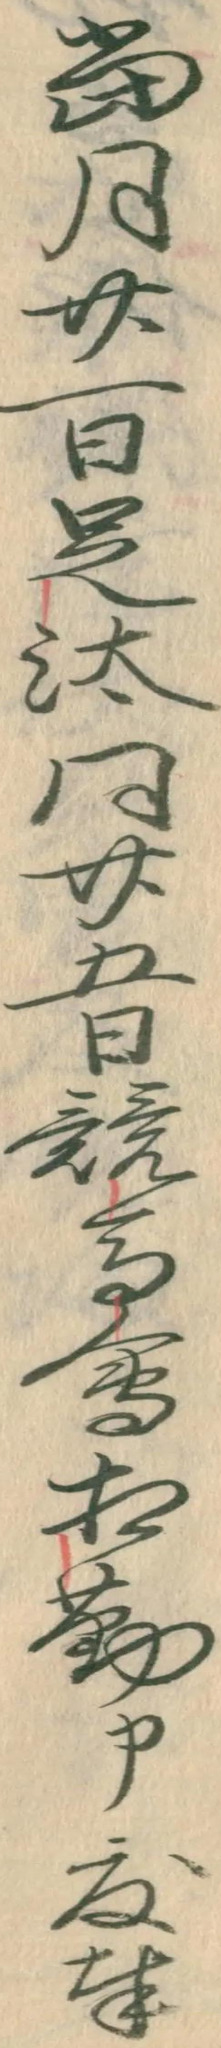当月廿一日足_汰同廿五日競-馬-会相_勤申度奉
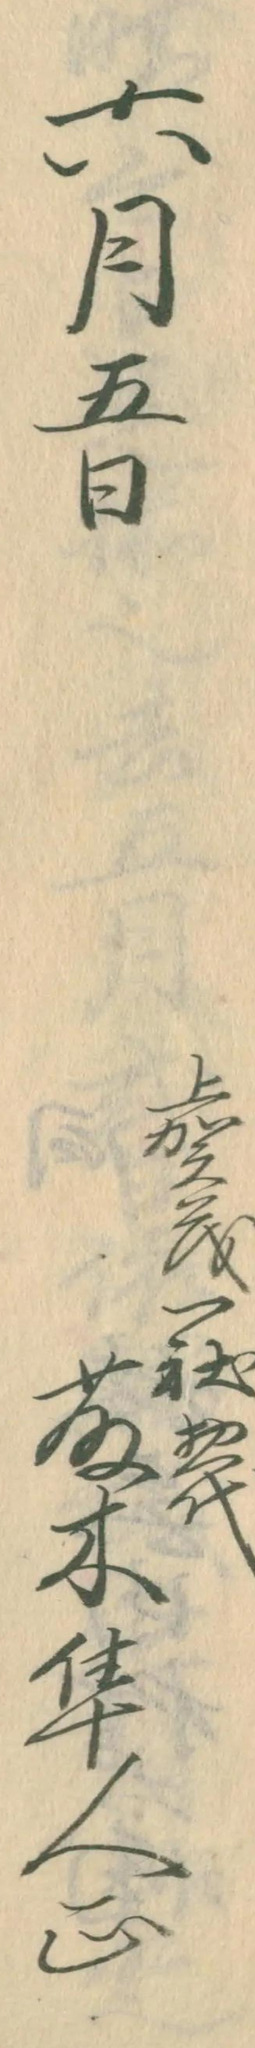六月五日藤木隼人正

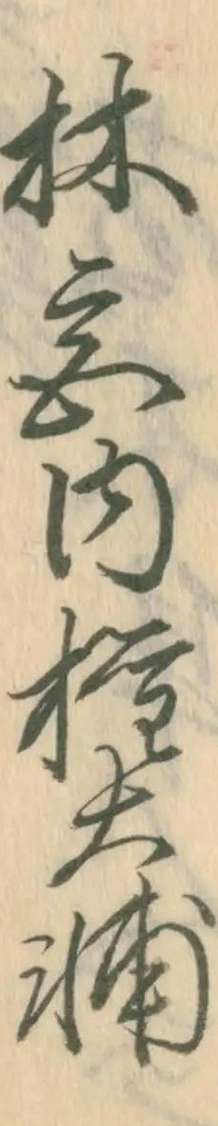林宮内権大輔
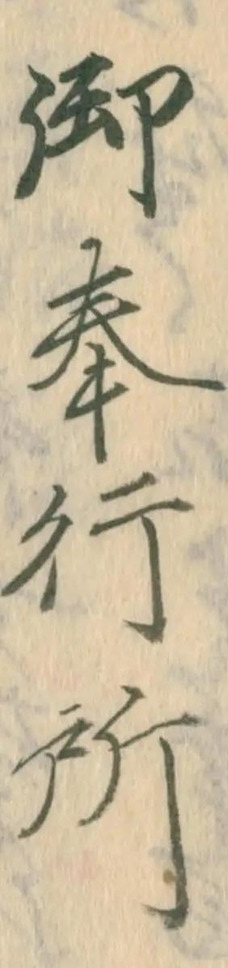御奉行所
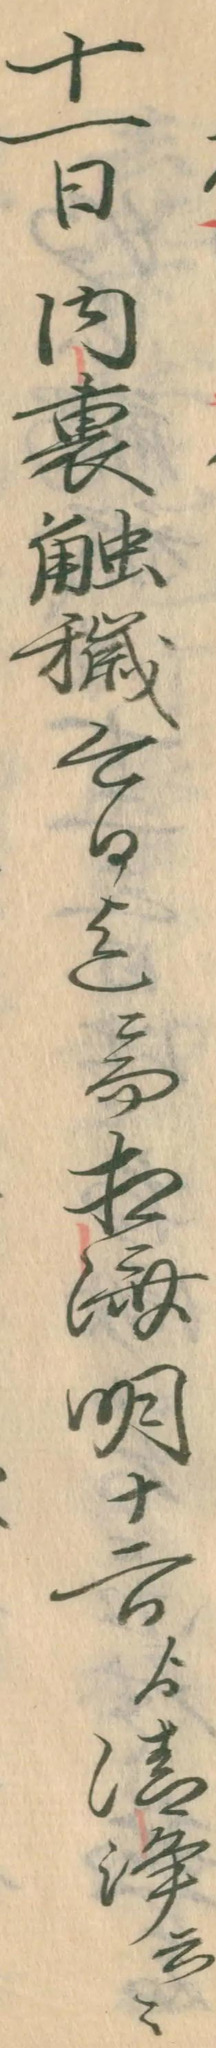十一日内-裏触穢今日迄ニ而相_済明十二日ゟ清-浄云々
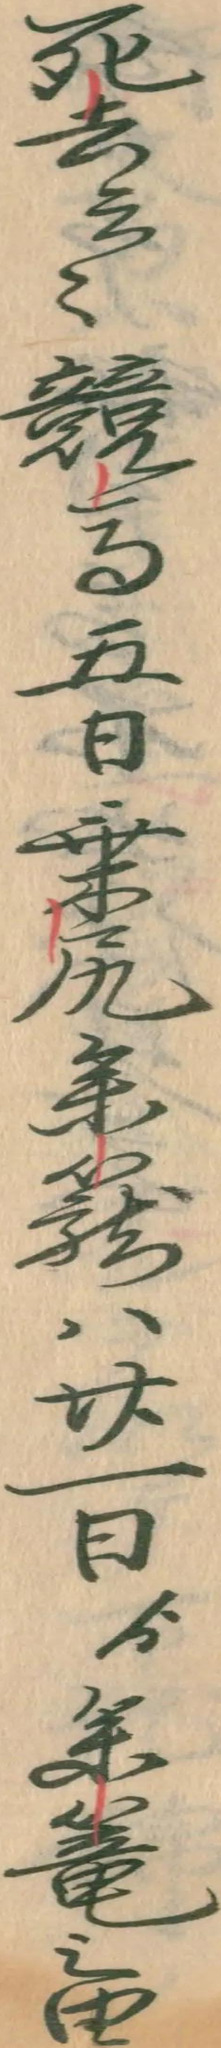死-去云々競-馬五日乗_尻参-籠ハ廿一日ゟ参-篭之由
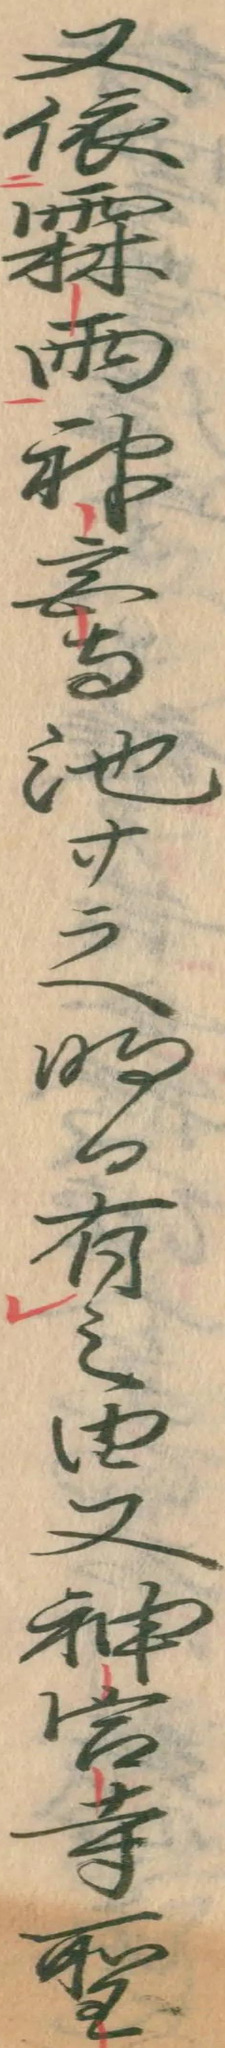又依霖-雨神-宮-寺池サラへ明日有之由又神-宮-寺聖-
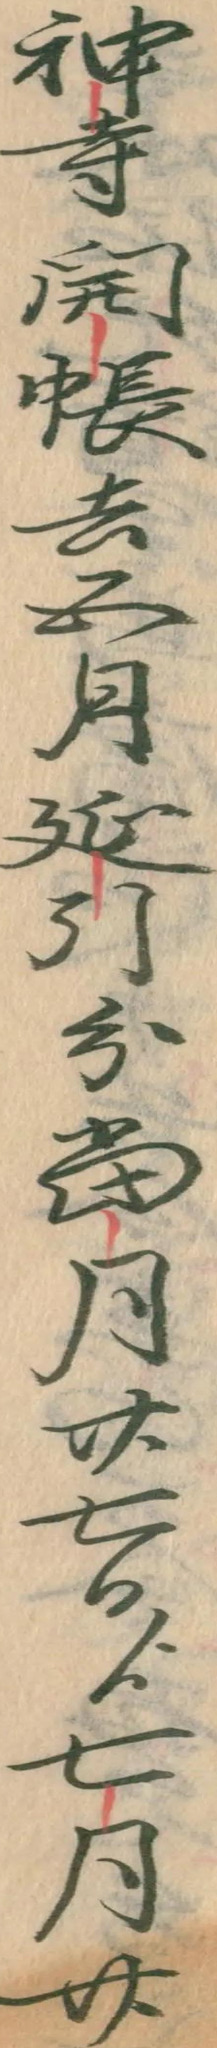神-寺開-帳去五月延-引分当-月廿七日ゟ七-月廿
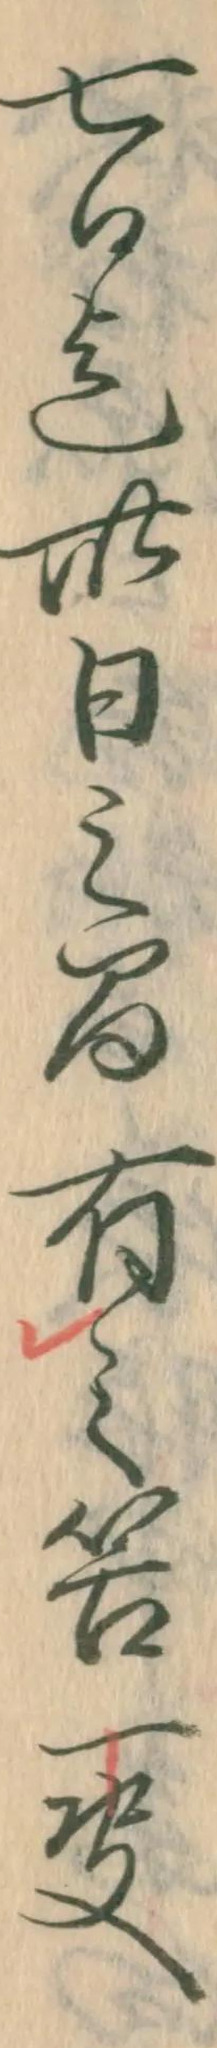七日迄卅日之間有之筈一-決
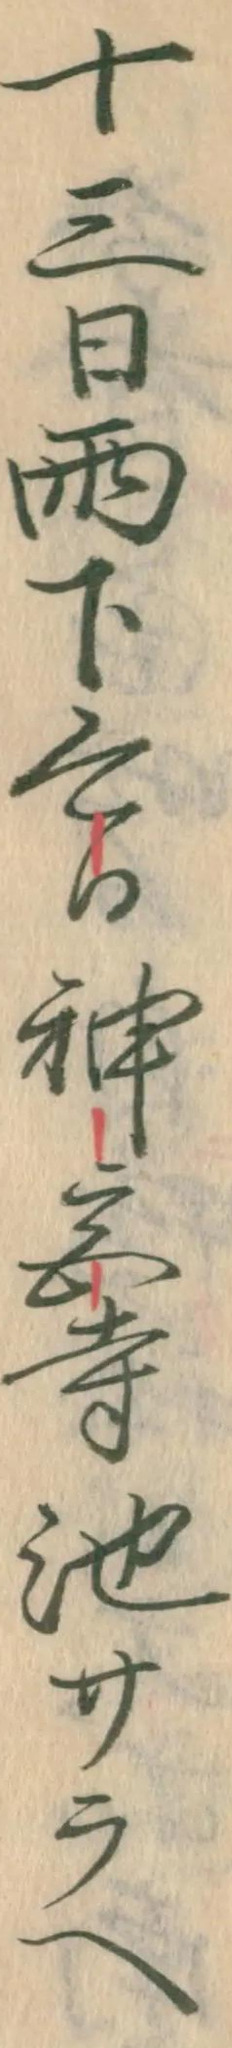十三日雨下今-日神-宮-寺池サラヘ
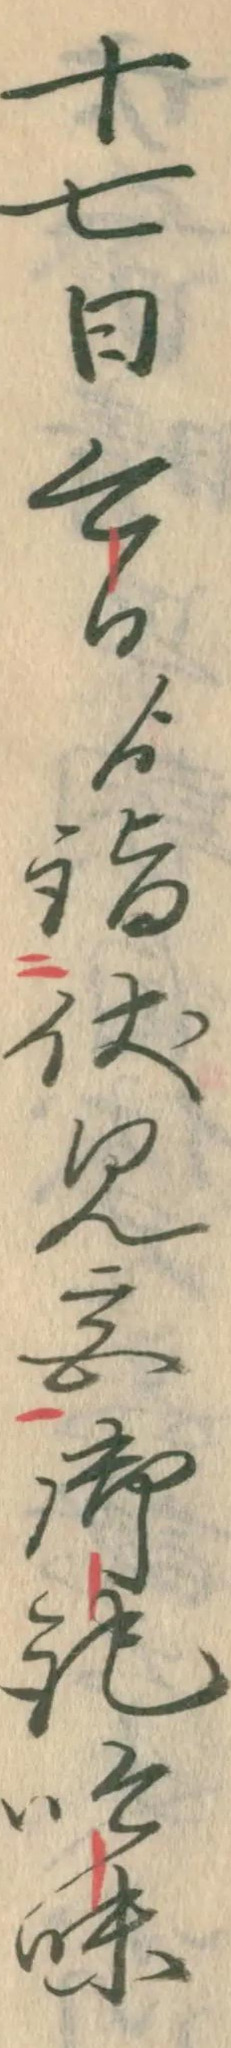十七日今-日ゟ詣伏見宮御-記吟-味
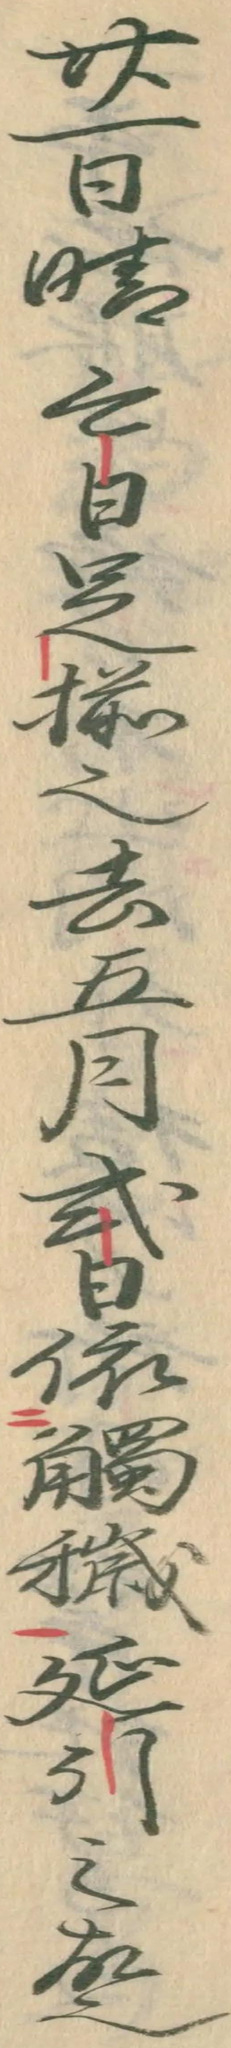廿一日晴今-日足_揃也去五月式-日依触穢延-引之故也

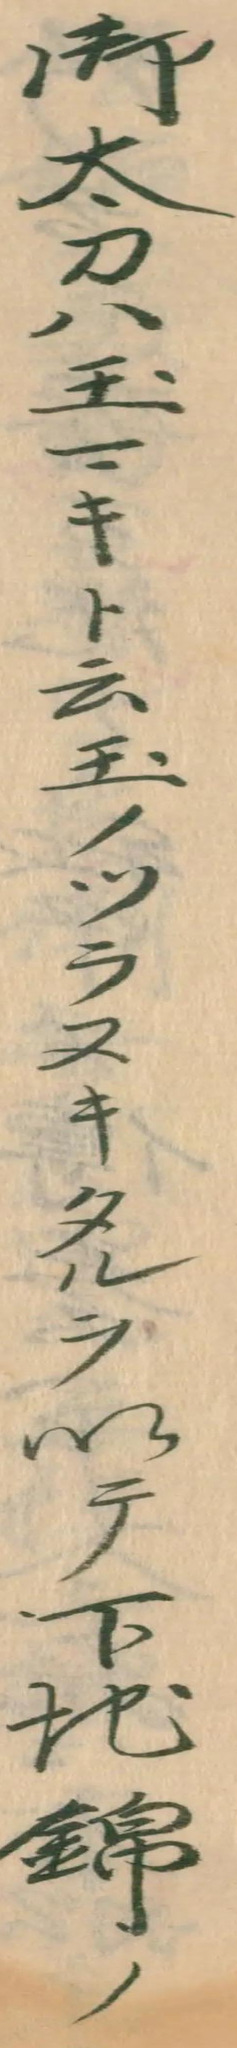御太刀ハ玉マキト云玉ノツラヌキタルヲ以テ下地錦ノ
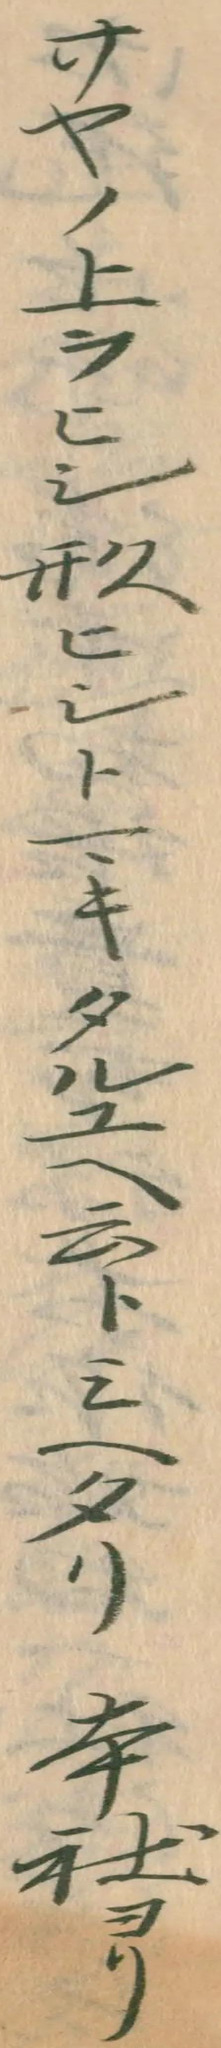サヤノ上ヲヒシ形ヒシトマキタルユヘ云トミヘタリ本社ヨリ
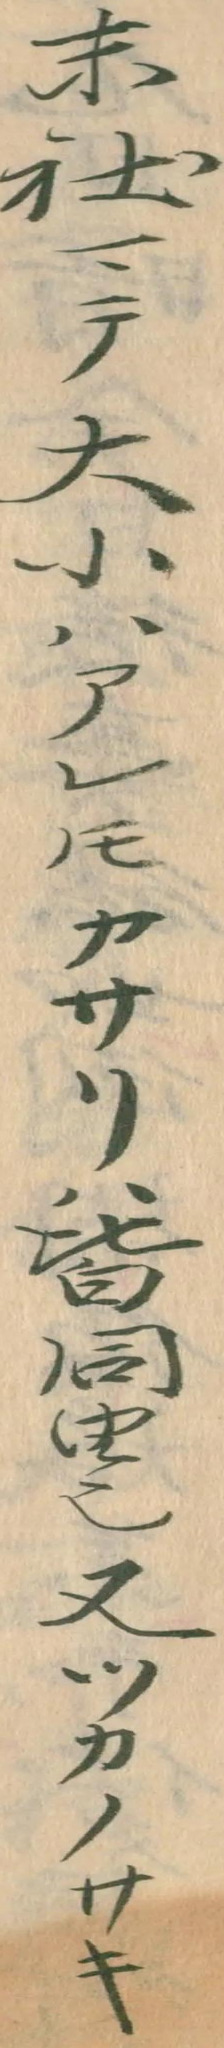末社マテ大小ハアレトモカサリハ皆同由也又ツカノサキ
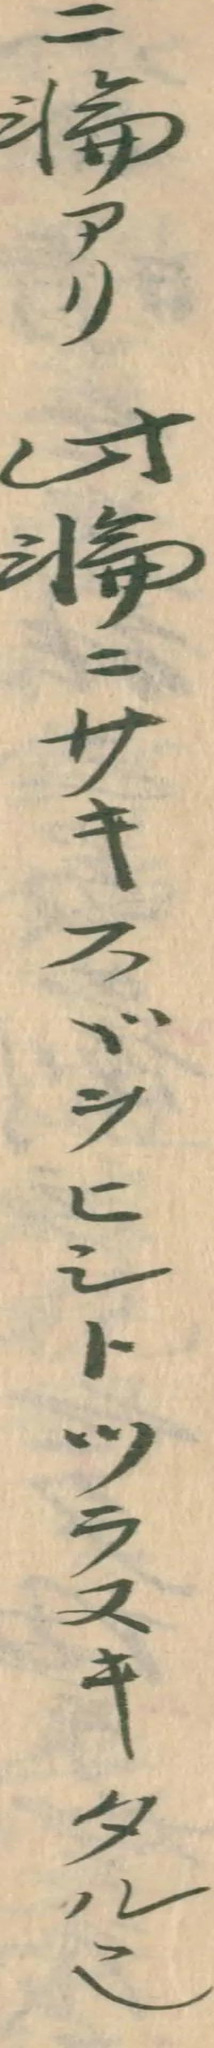ニ輪アリ此輪ニサキスヾヲヒシトツラヌキタル也
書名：賀茂社記録. 第16冊
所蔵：国立国会図書館 National Diet Library, JAPAN
